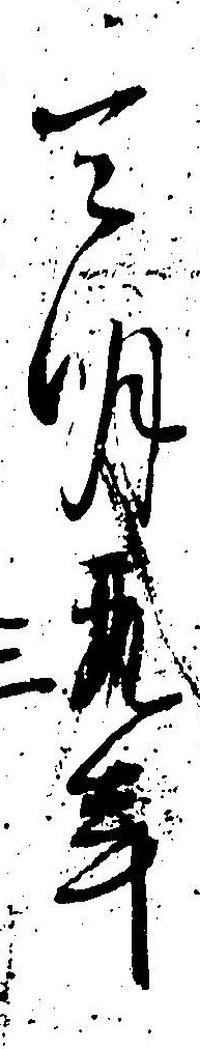天明三年

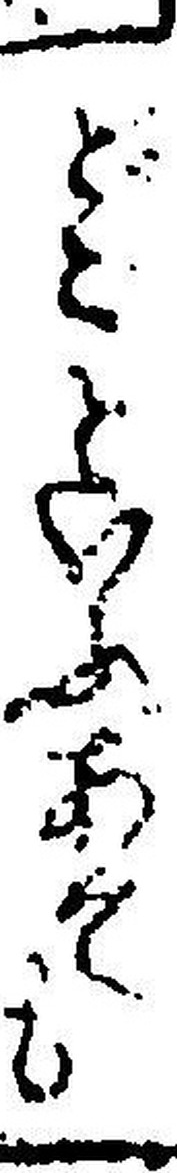どこといふあても
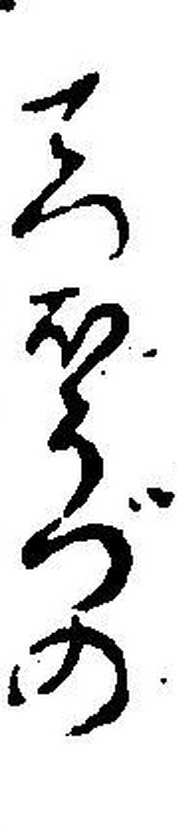てつほうづの
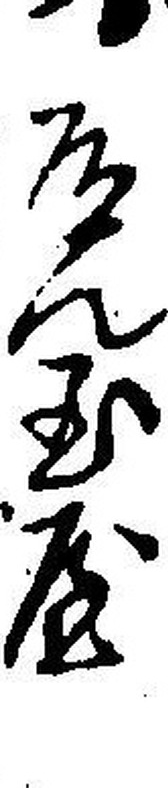へん玉屋
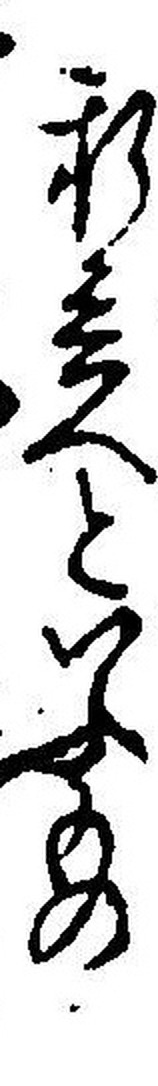新兵衛といふもの
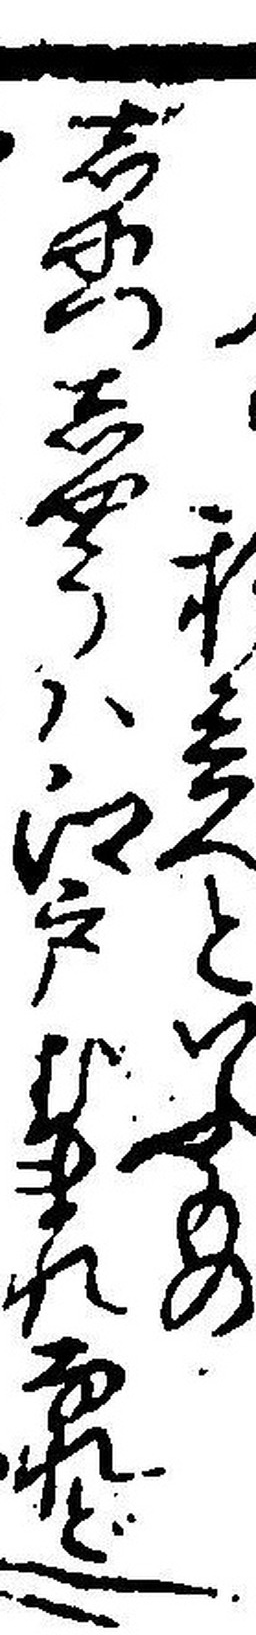しゆつしやうは江戸むまれなれど
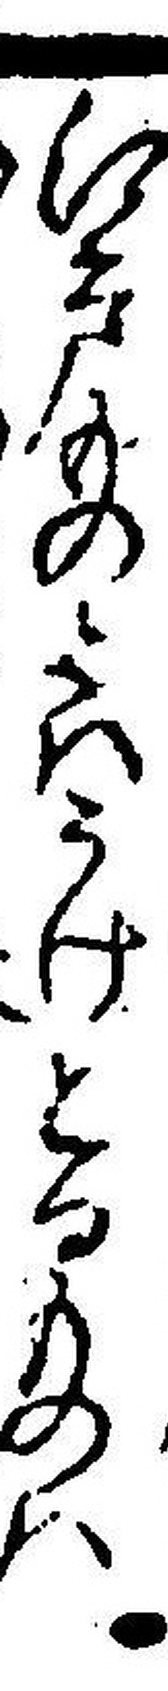江戸のものとはうけとるものは
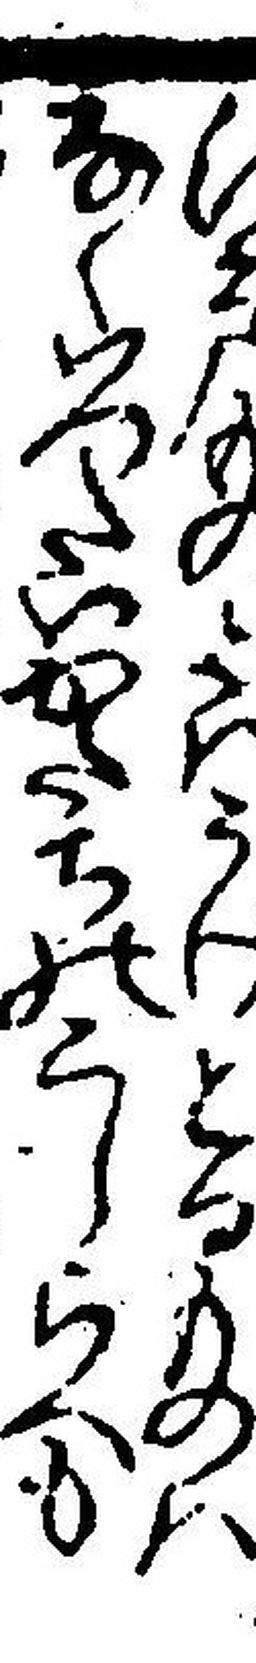なくいつたいかたちのこしらへも
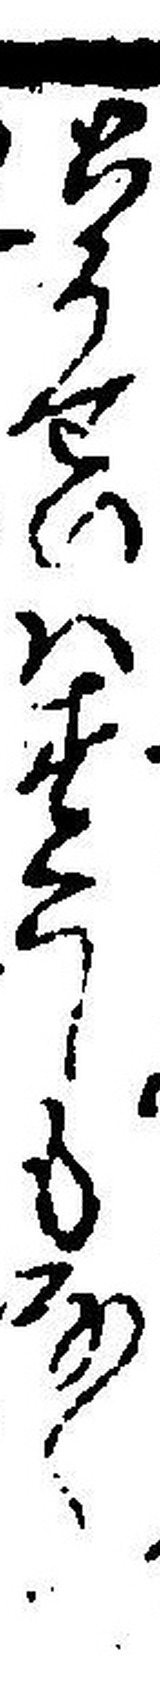とうせいはすこしもなく
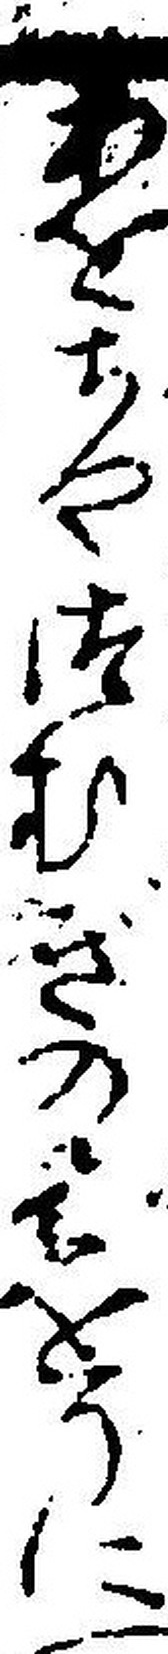あをちやつむぎのをりに
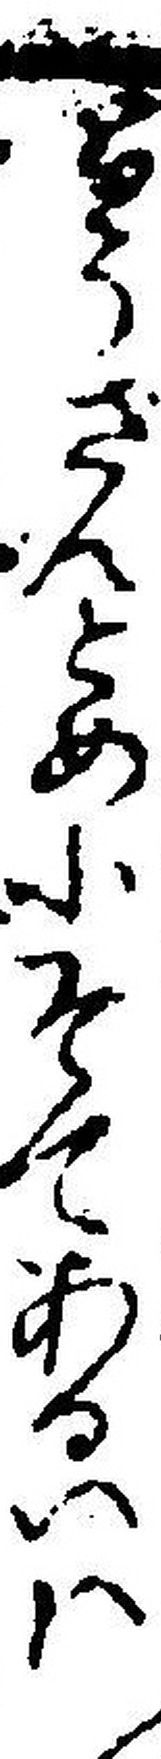とうざんとめ小そてあるいは
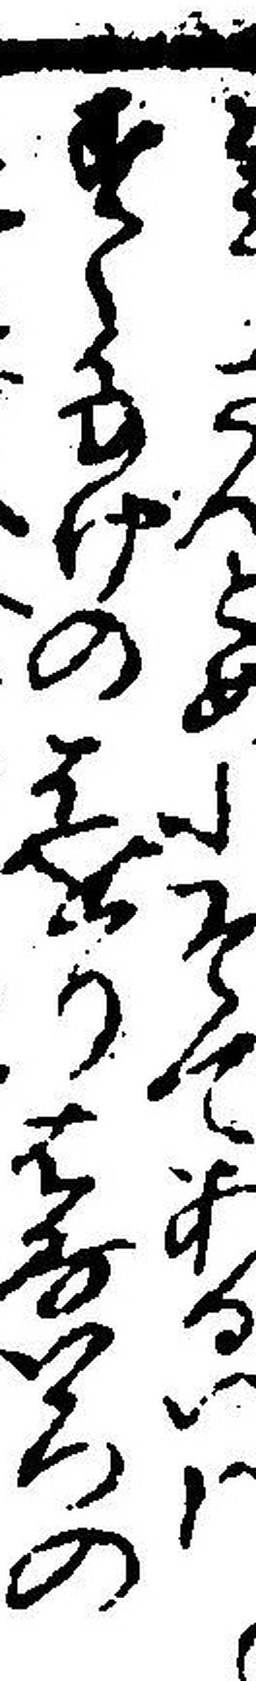すゝたけのはをりはないろの
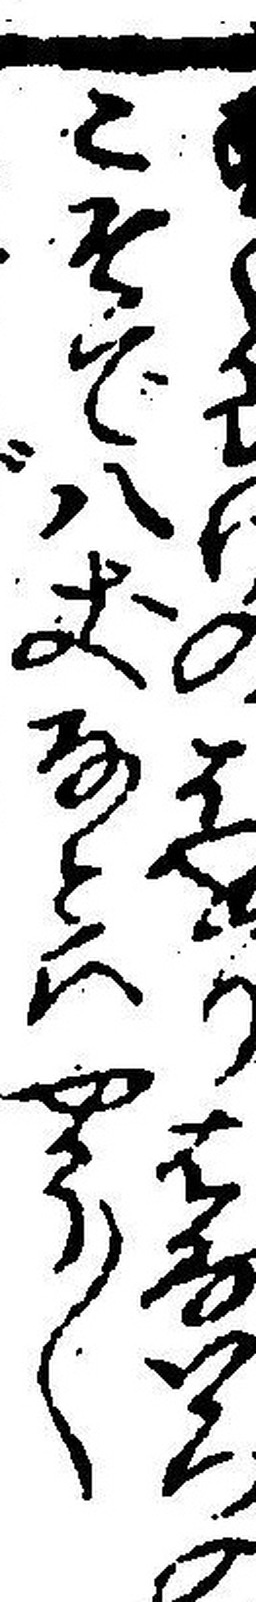こそで八丈なとはやう〳〵
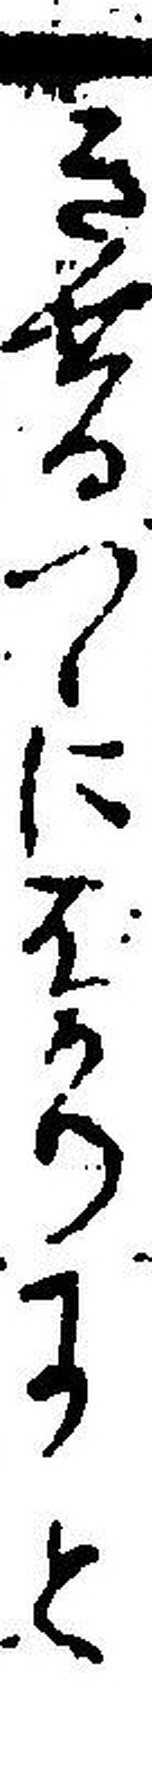きせるづゝにばかりにと
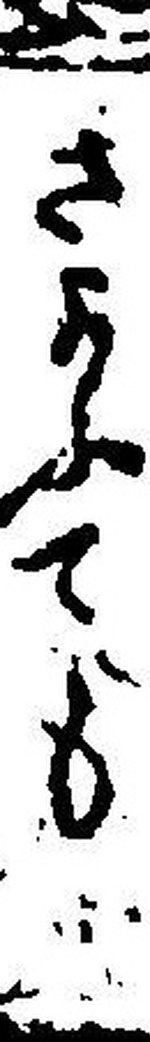さよふても
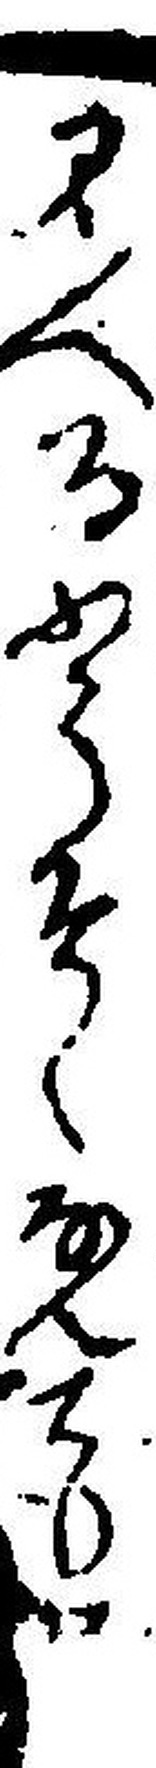見へるふうそくなんても
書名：間違狐之女郎買 / 市場通笑作
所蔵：東京大学総合図書館 General Library in the University of Tokyo, JAPAN
